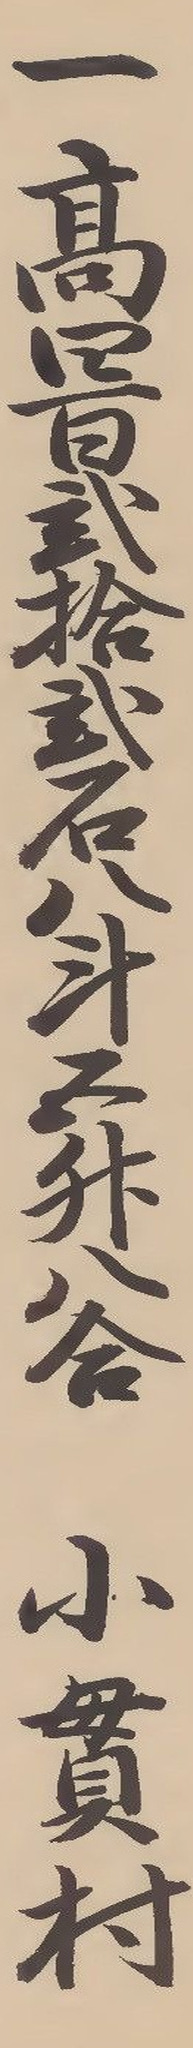一高四百弐拾弐石八斗五升八合小貫村
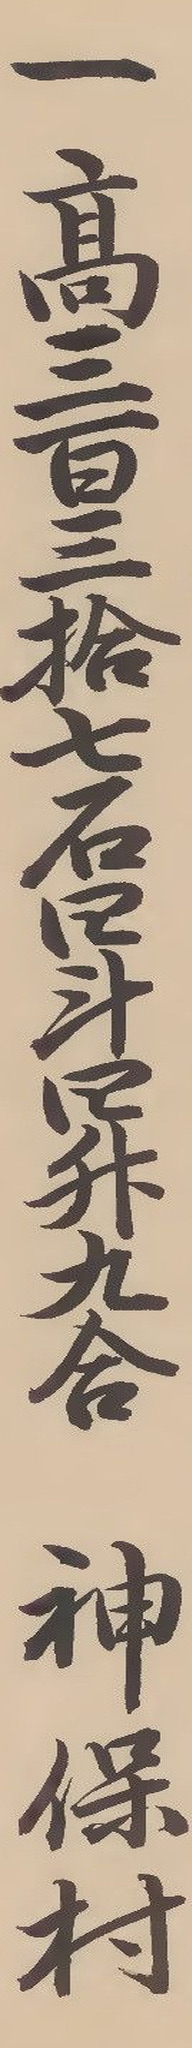一高三百三拾七石四斗四升九合神保村
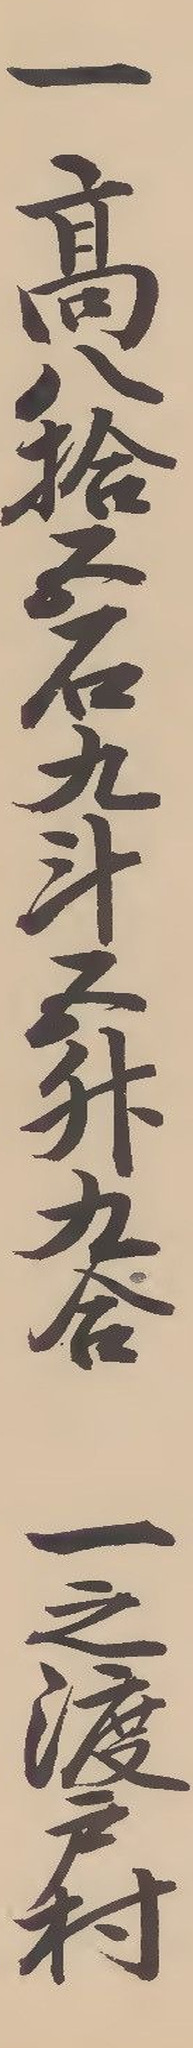一高八拾五石九斗五升九合一之渡戸村

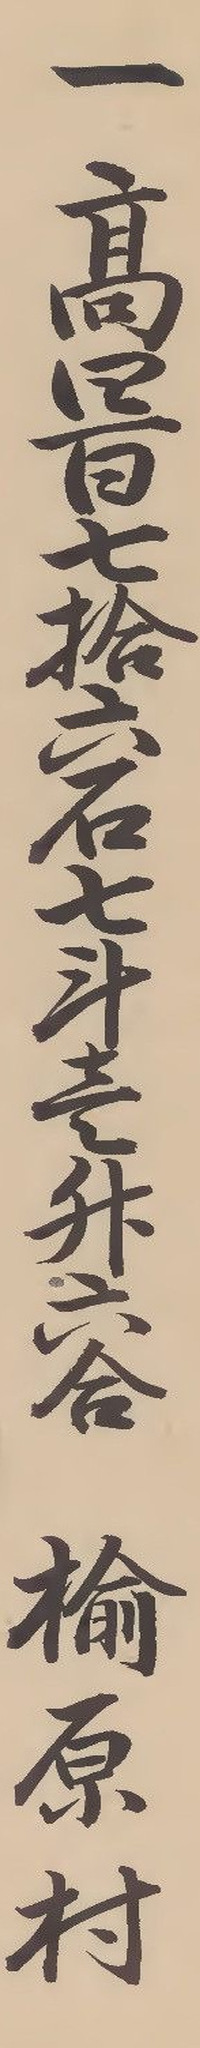一高四百七拾六石七斗壱升六合楡原村
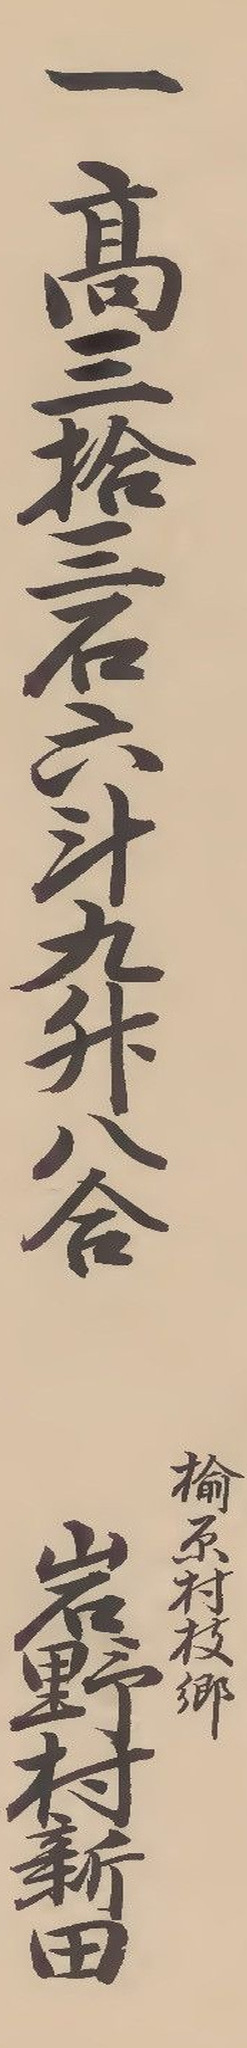一高三拾三石六斗九升八合岩野村新田
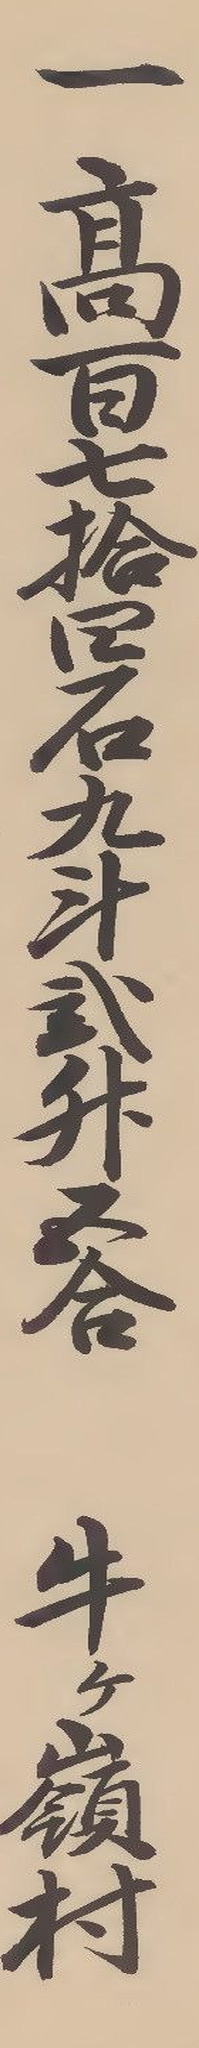一高百七拾四石九斗弐升五合牛ヶ嶺村
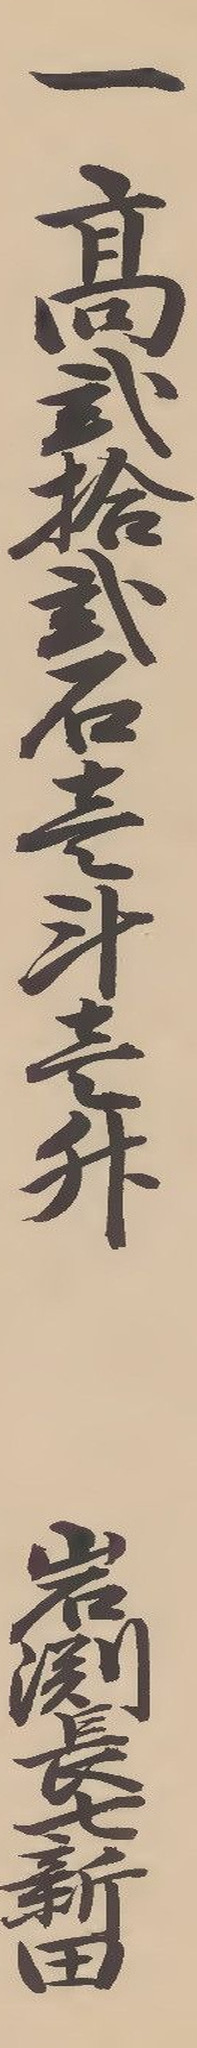一高弐拾弐石壱斗壱升岩淵長七新田
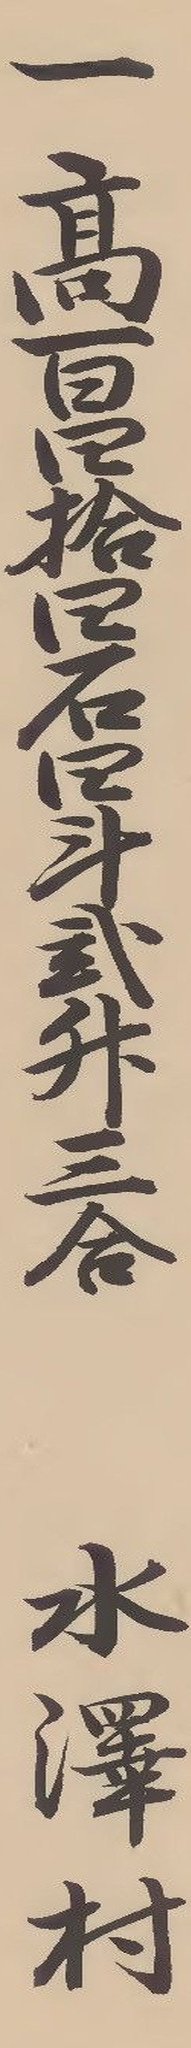一高百四拾四石四斗弐升三合水沢村
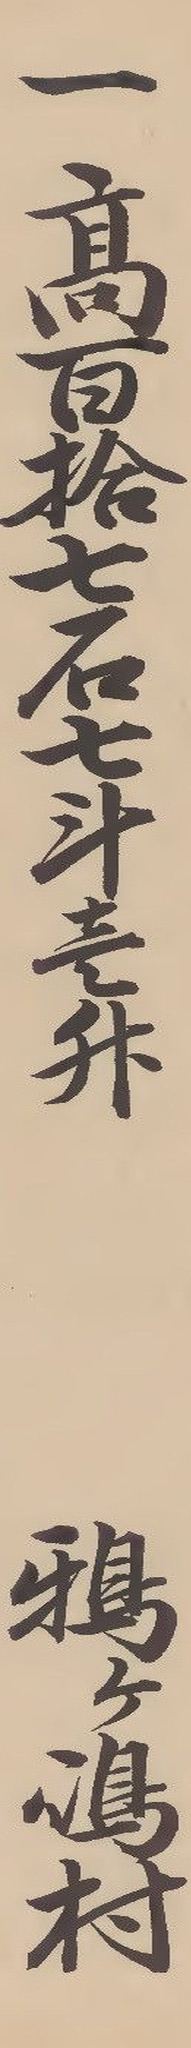一高百拾七石七斗壱升鴉ヶ島村
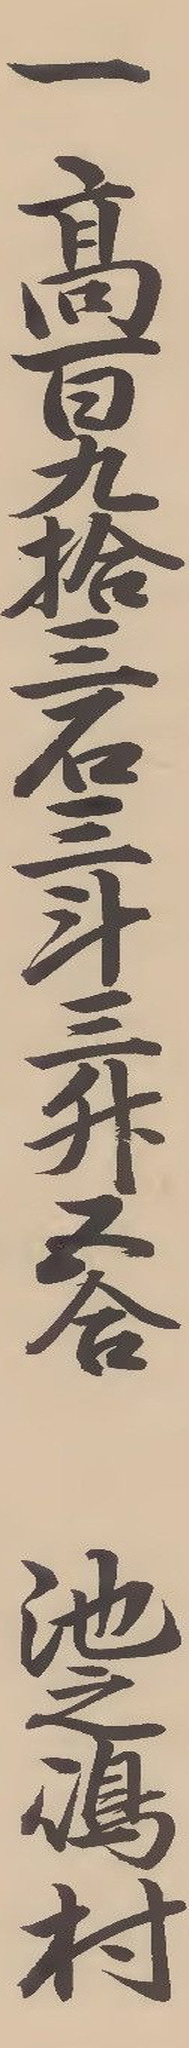一高百九拾三石三斗三升五合池之島村
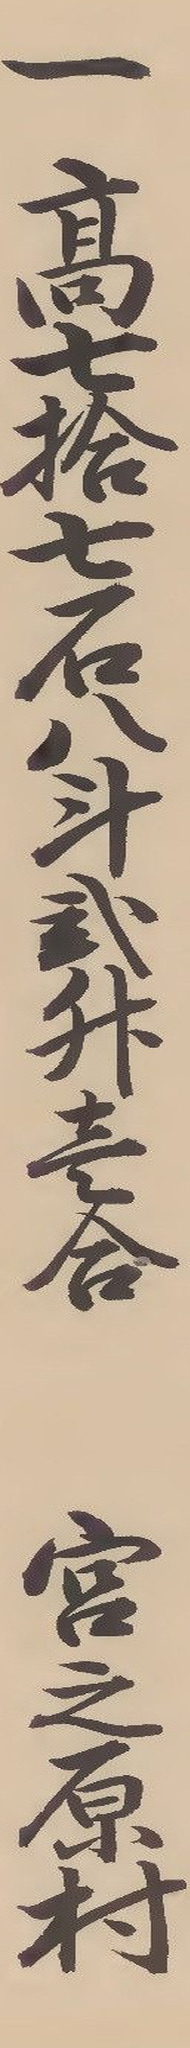一高七拾七石八斗弐升壱合宮之原村

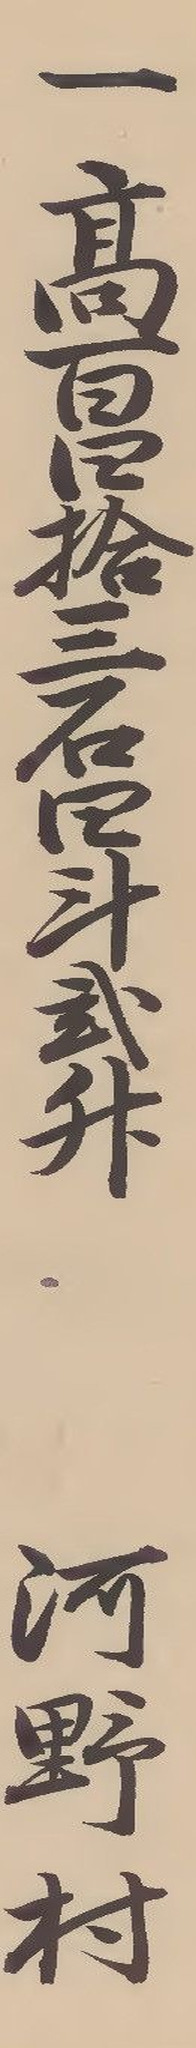一高百四拾三石四斗弐升河野村
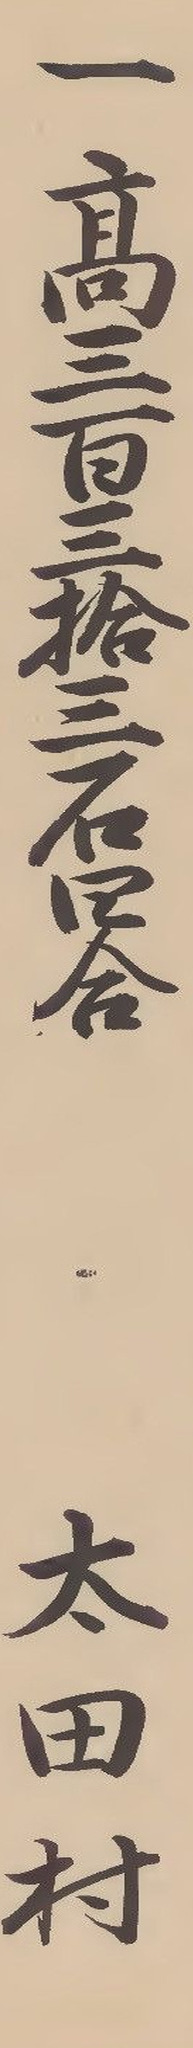一高三百三拾三石四合太田村
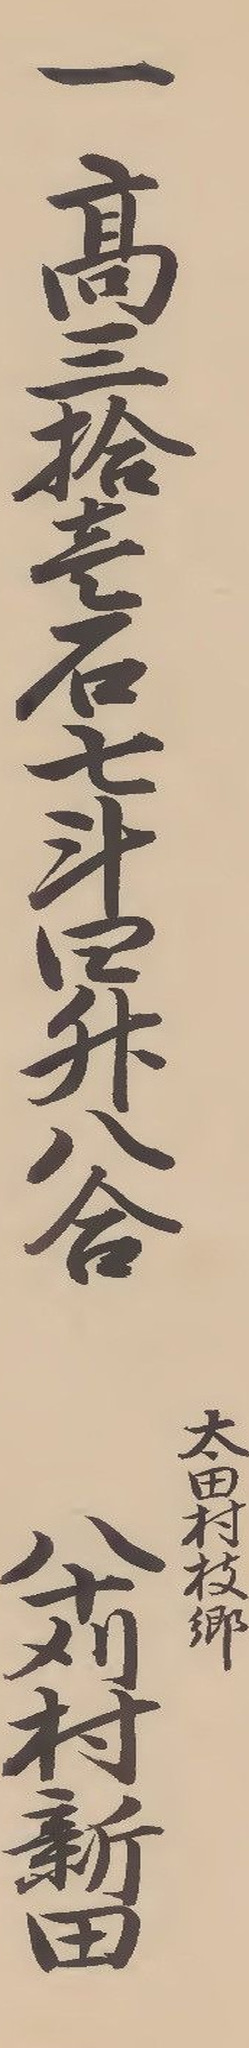一高三拾壱石七斗四升八合八十刈村新田
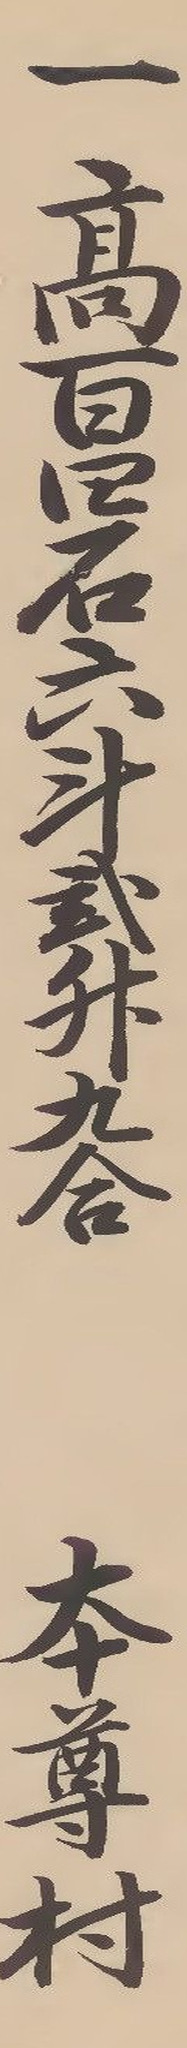一高百四石六斗弐升九合本尊村
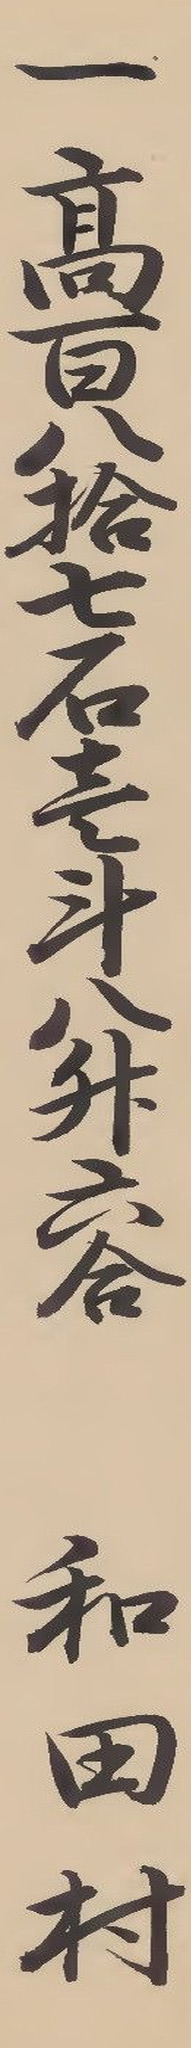一高百八拾七石壱斗八升六合和田村
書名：越後国郷帳　中
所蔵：国立公文書館 National Archives of Japan
